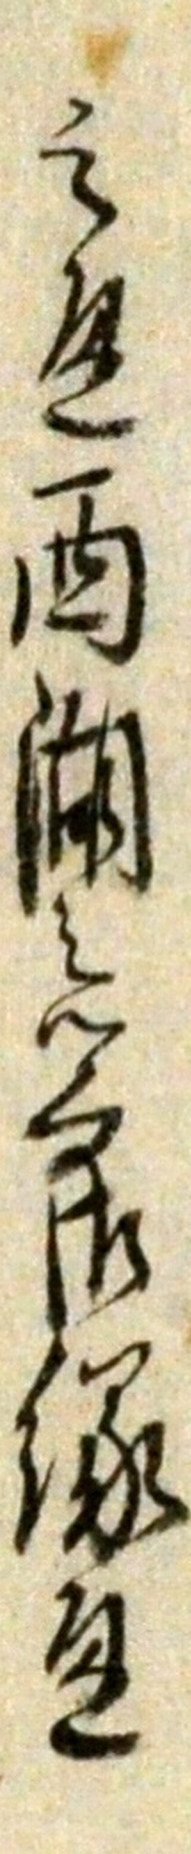之通西湖之間御縁通
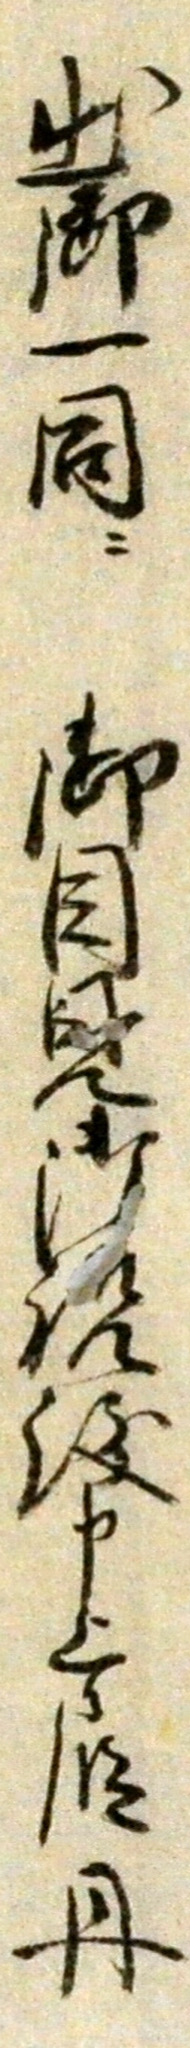出御一同ニ御目見御祝儀申上候段丹
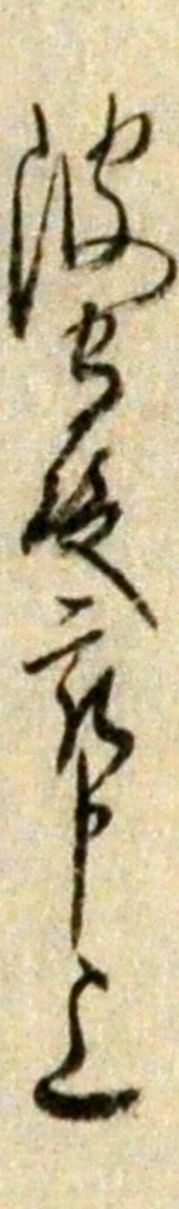波守殿被申上
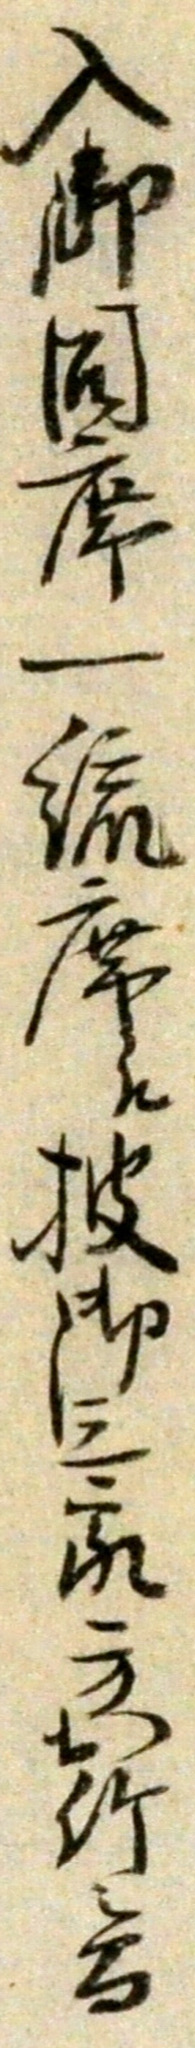入御同席一統席え披御三家方於竹之間
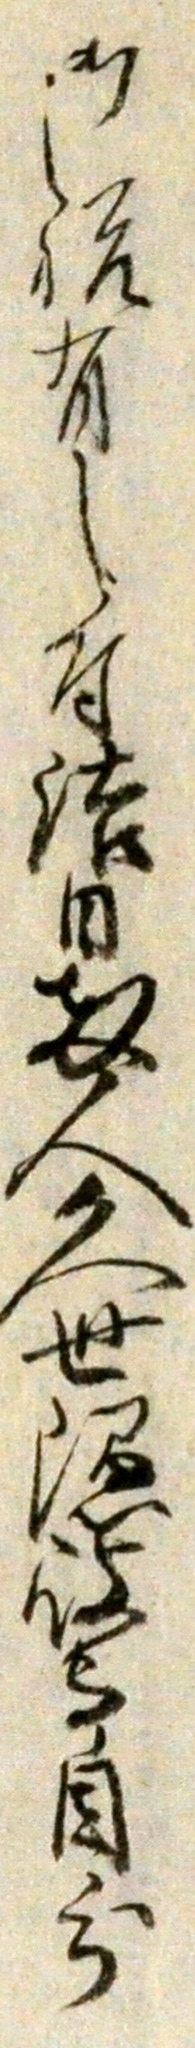御祝有之ニ付詰日両人久世隠岐守自分
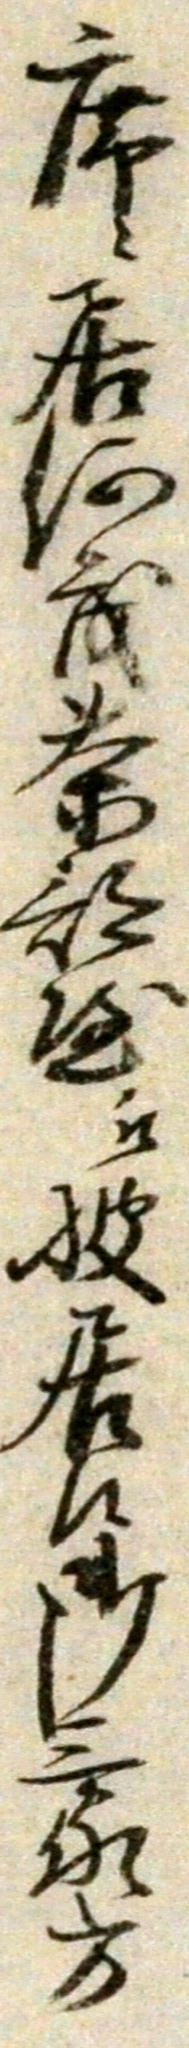席ニ居何も茶部屋え披居候御三家方
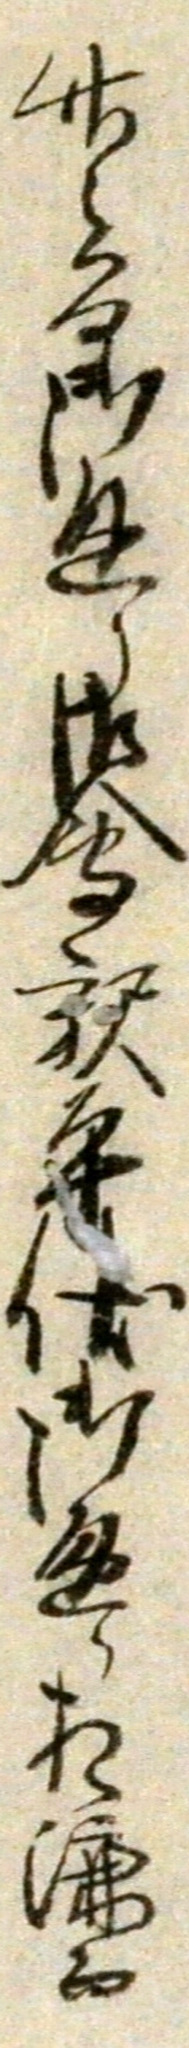此之間御通り御會釈平伏御通り相済而
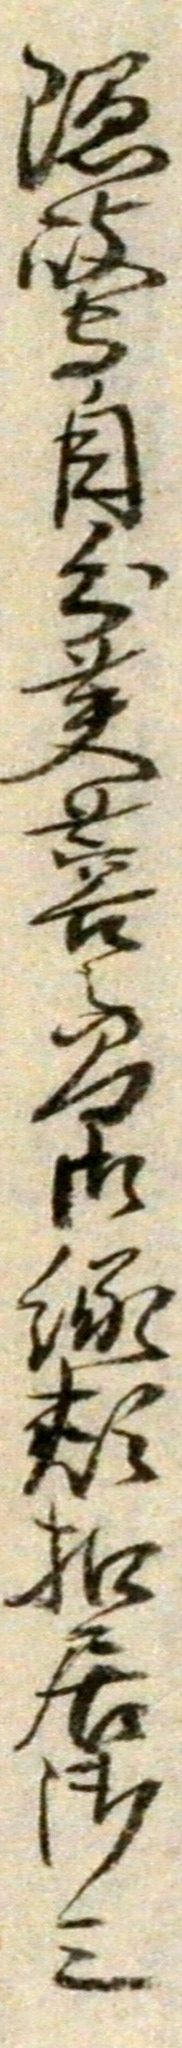隠岐守自分芙蓉之間御縁頬扣居御三
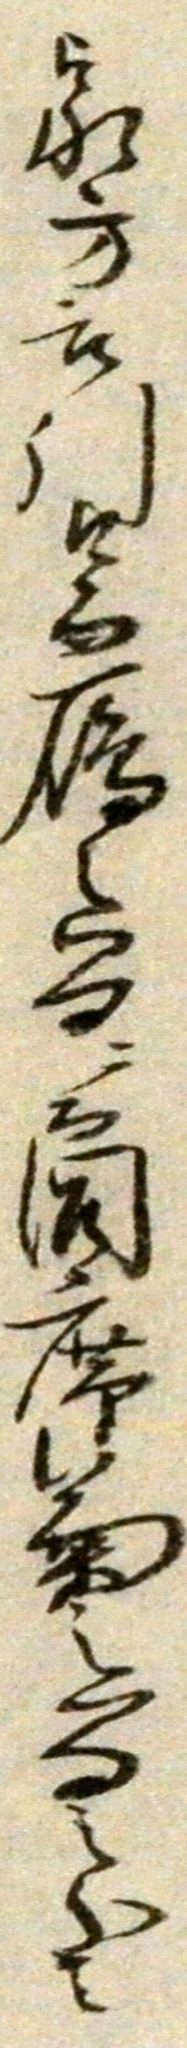家方被引候而雁之間ニ而同席菊之間之分者
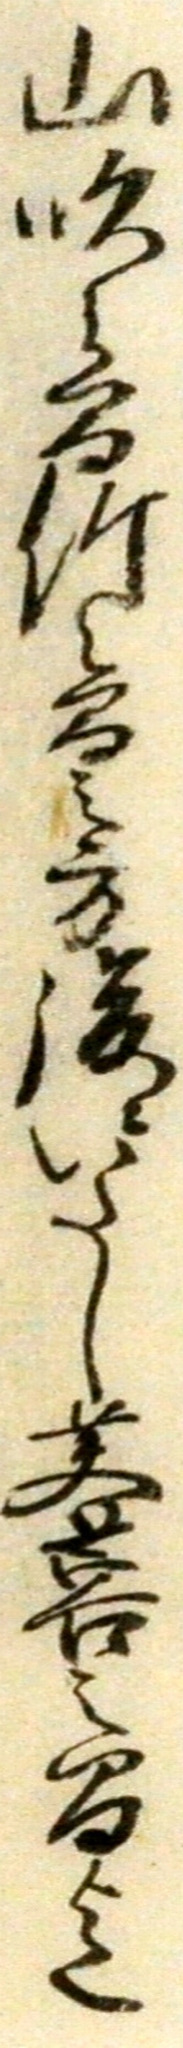山吹之間竹之間之方後ニいたし芙蓉之間迄
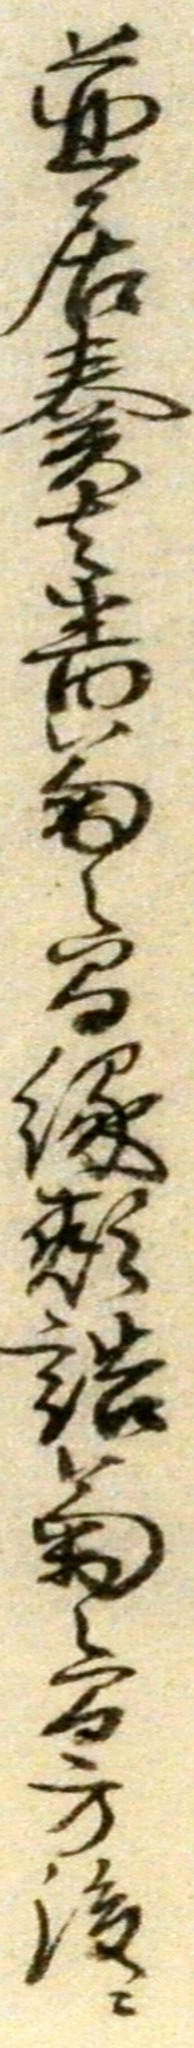並居奏者番菊之間縁頬詰菊之間方後ニ
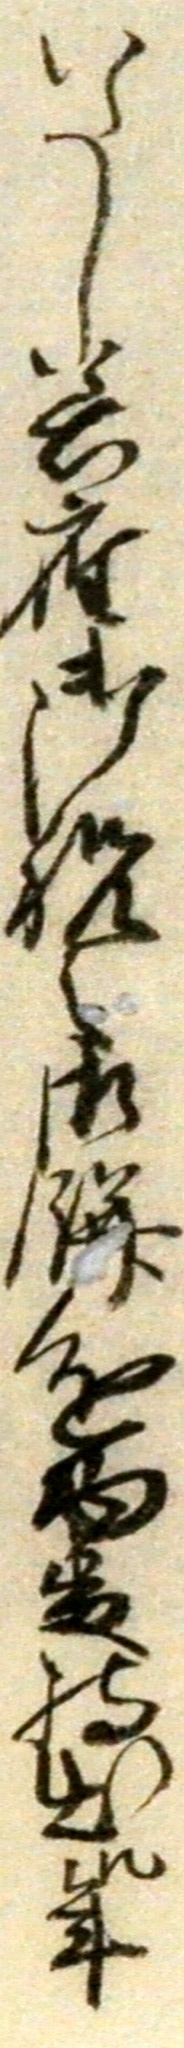いたし着座御祝之御餅近習番持出候年
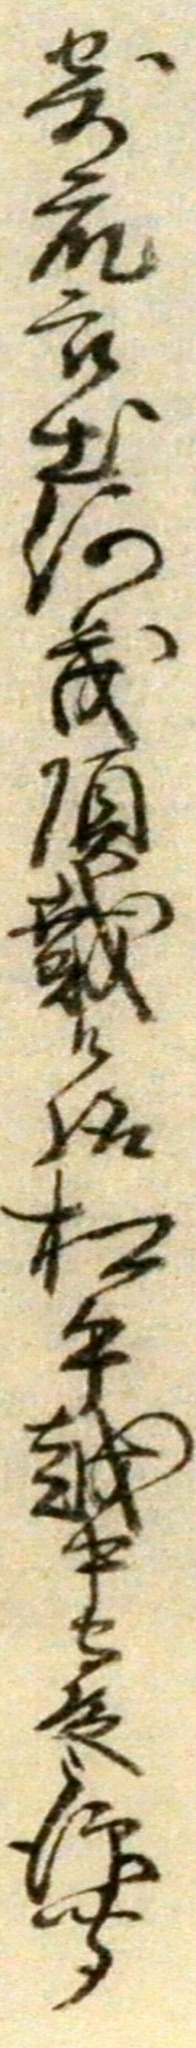寄衆被出何も頂戴候様松平越中守殿被仰聞
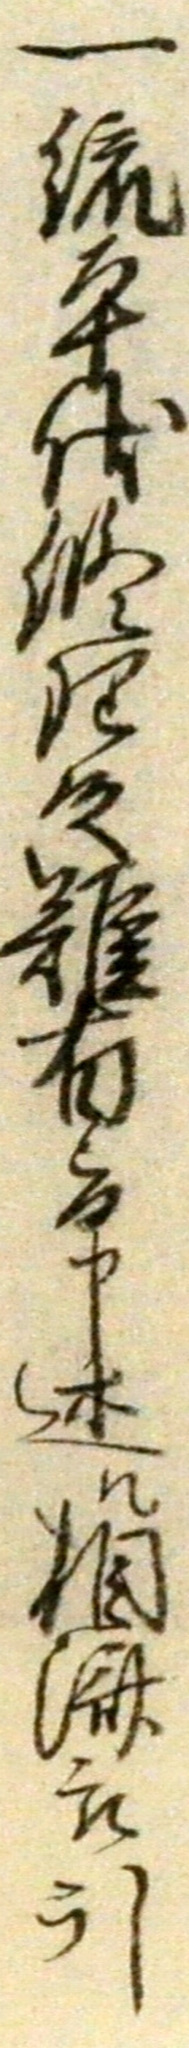一統平伏修理殿難有旨申述候相済被引

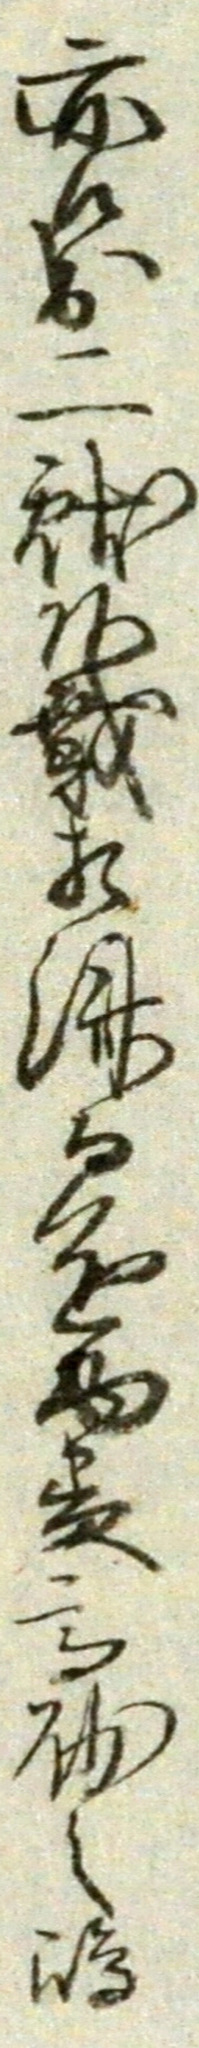亦候出ニ献頂戴相済而近習番高砂ノ嶋
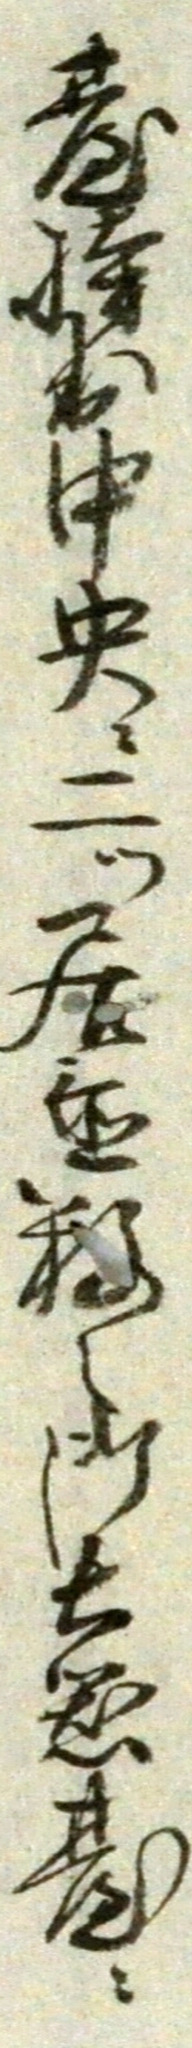臺持出中央ニニツ居置数之御土器臺ニ
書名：若君様（家斉嫡男）誕生諸祝儀ノ節ノ留書外
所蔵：伊那市立高遠町図書館・合同会社AMANE
